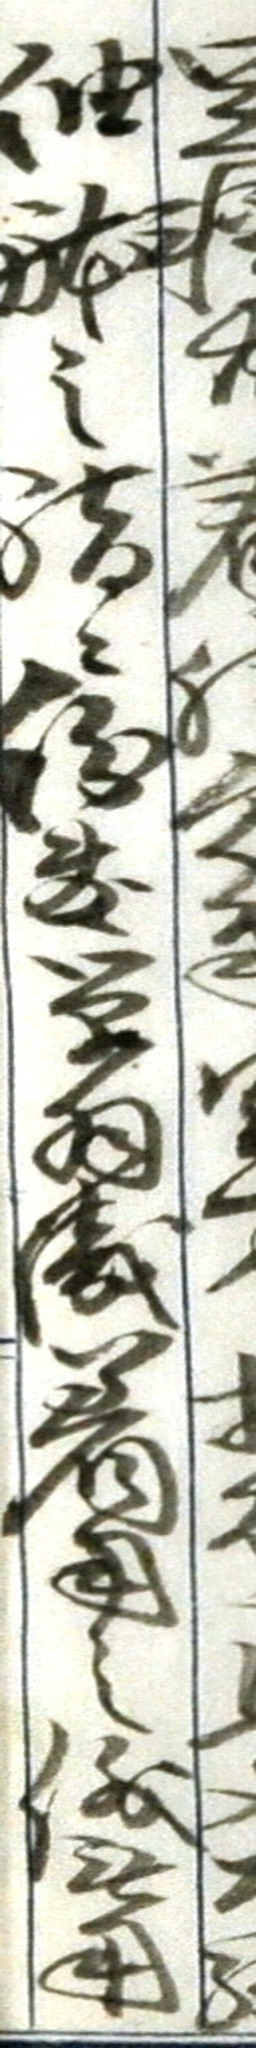紬躰之絹ニ紛敷単羽織着用之儀無用

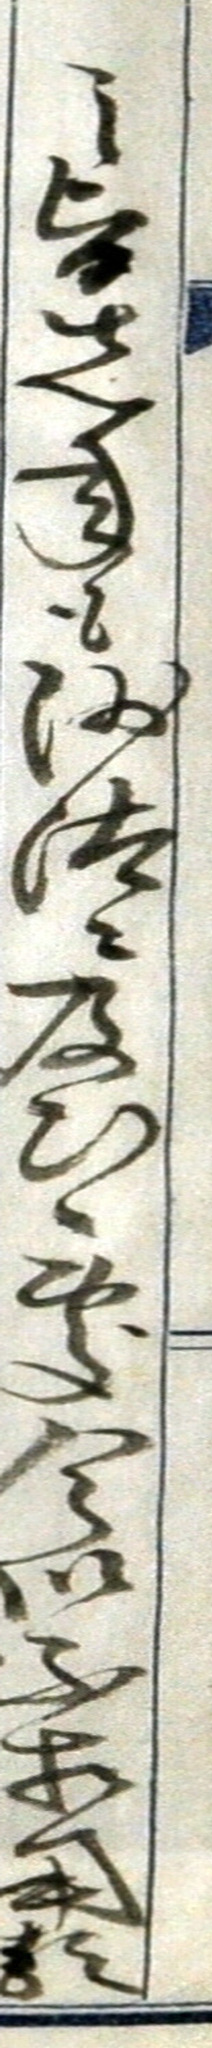之旨先年も沙汰ニ及ひ候処今以不相用類
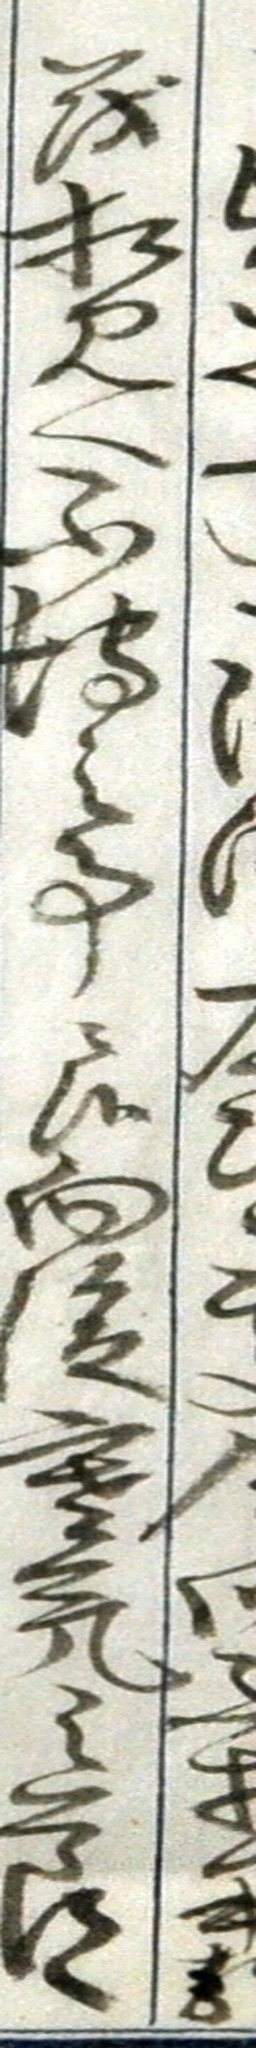も相見へ不埒之事ニ候向後寒気之節
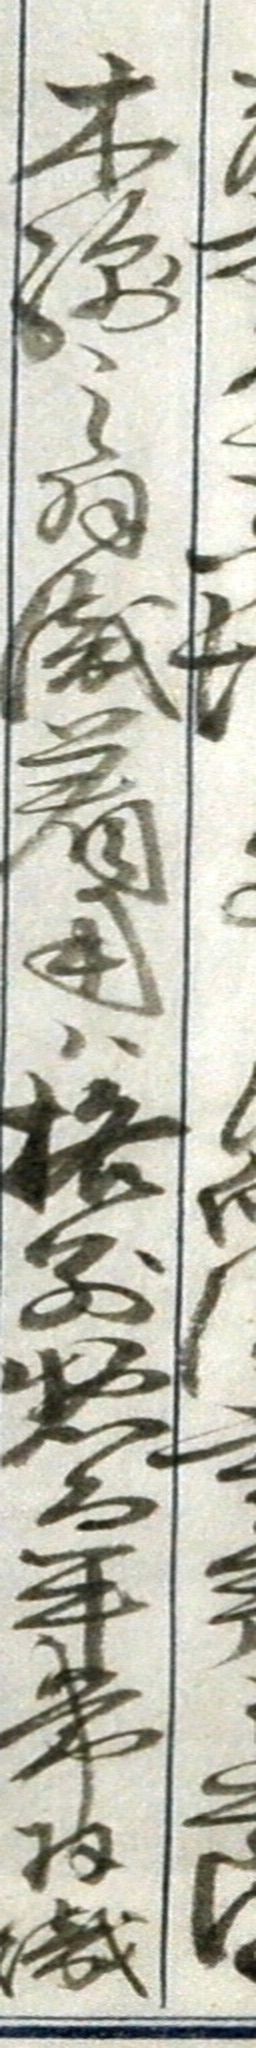木綿之羽織着用ハ格別惣而平常羽織
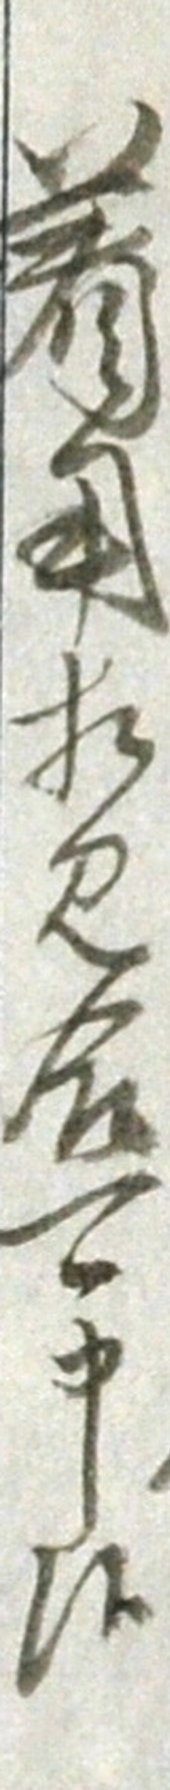着用相見合可申候
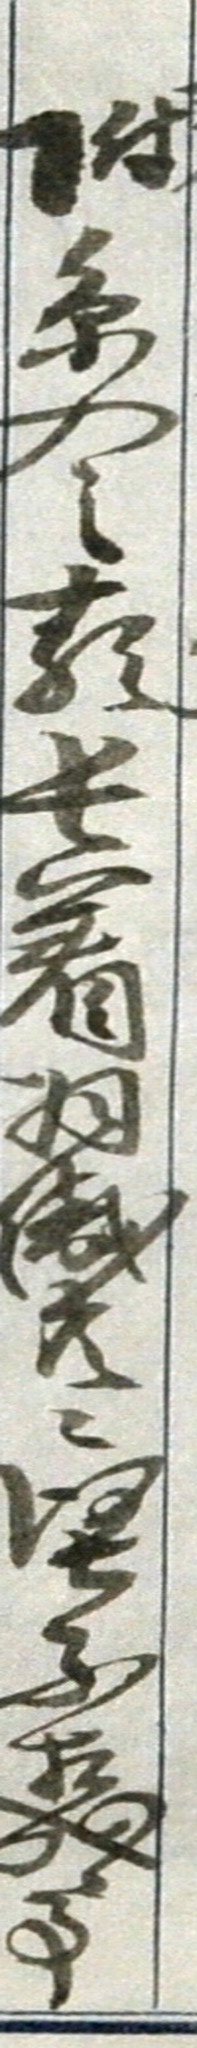附糸入之類長着羽織共ニ堅不相成候事
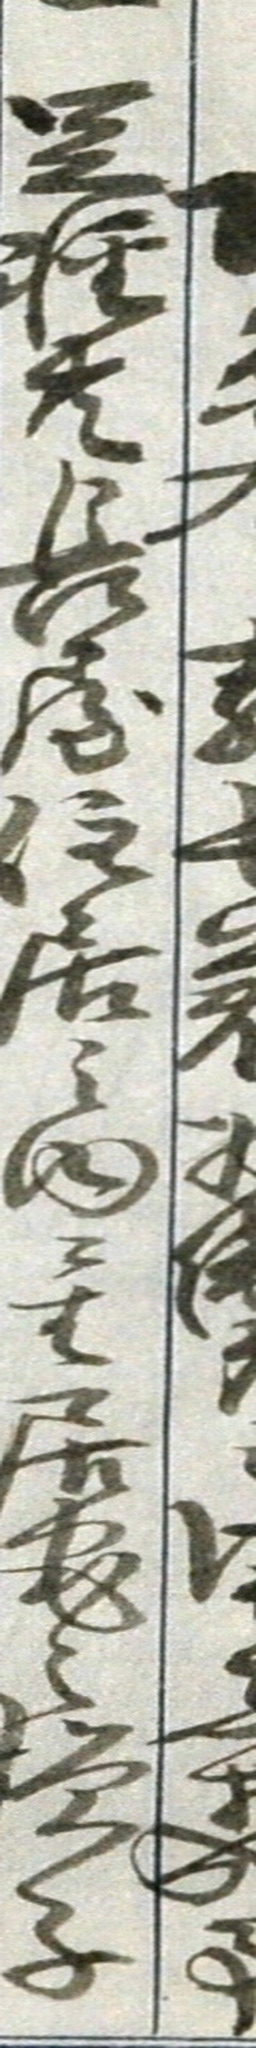一足軽共長屋住居之内ニは居宅之様子
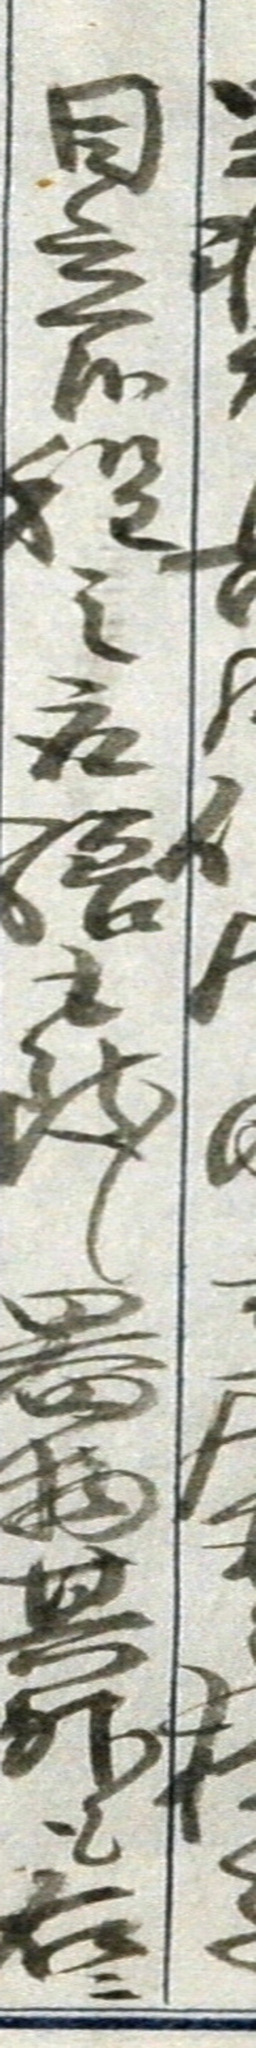目立候程之取繕も致し器物其外も右ニ
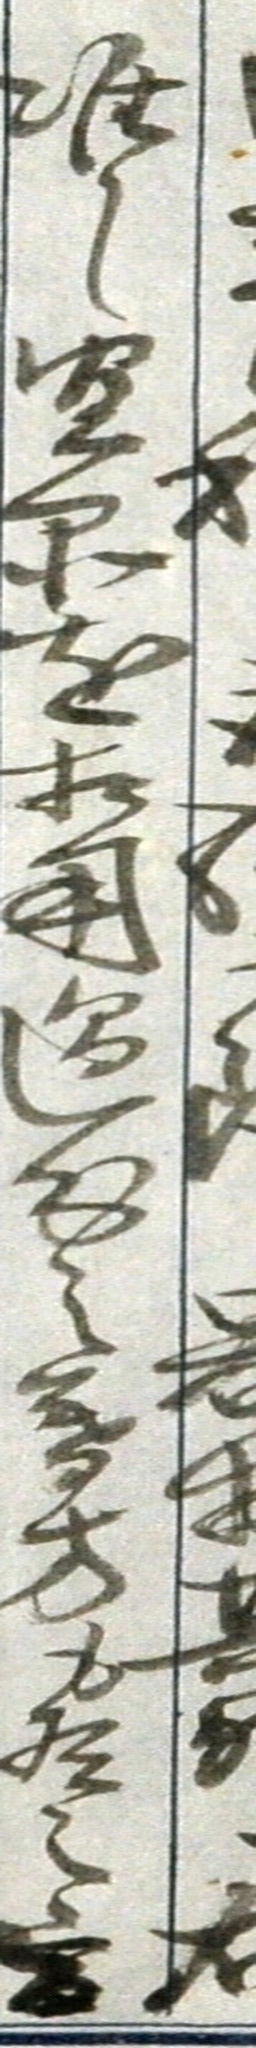准し宜品を相用過分之暮方も有之旨
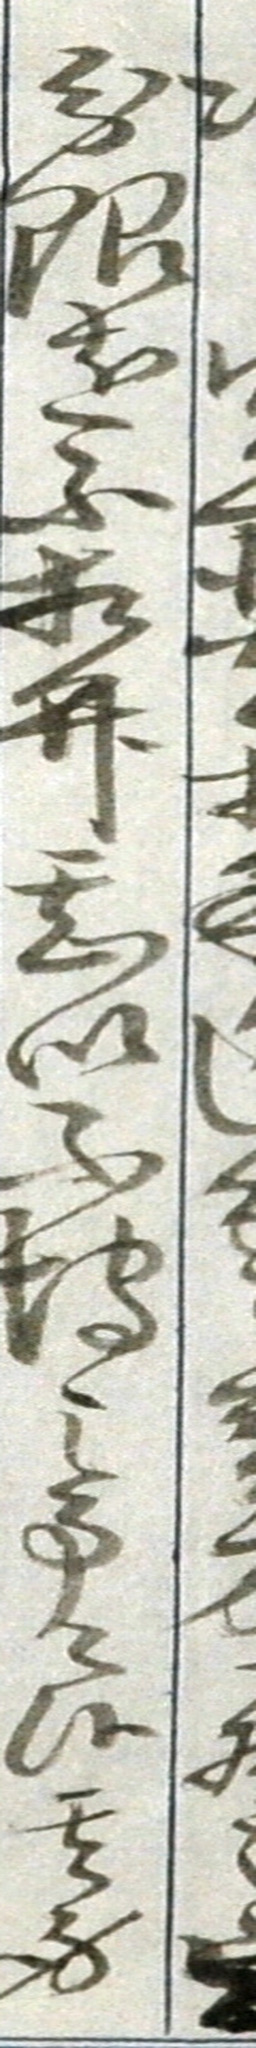分限を不相弁甚以不埒之事ニ候其身
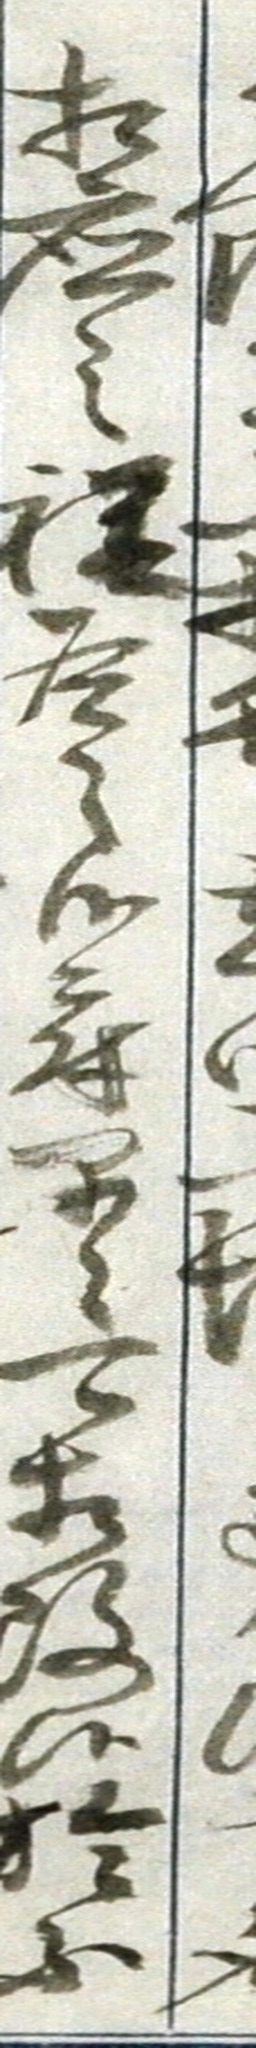相応之程有之候ニ付早々可相改候於不
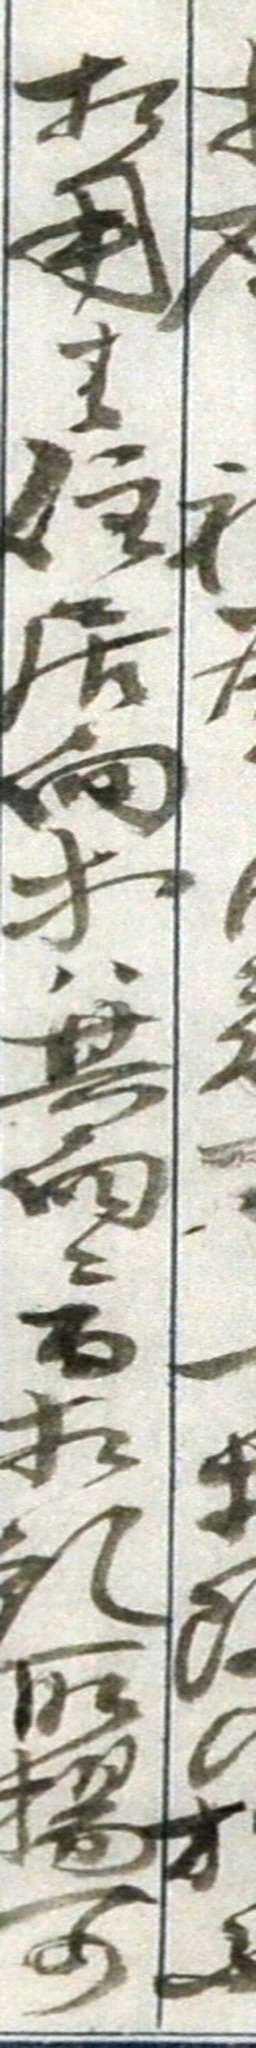相用は住居向等ハ其向ニ而相糺取揚可
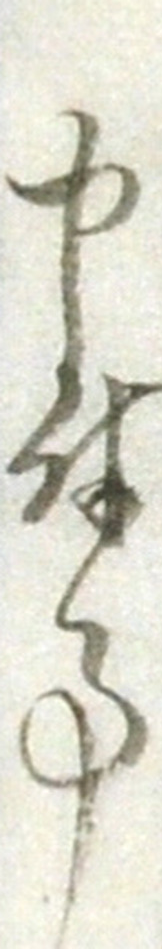申付事
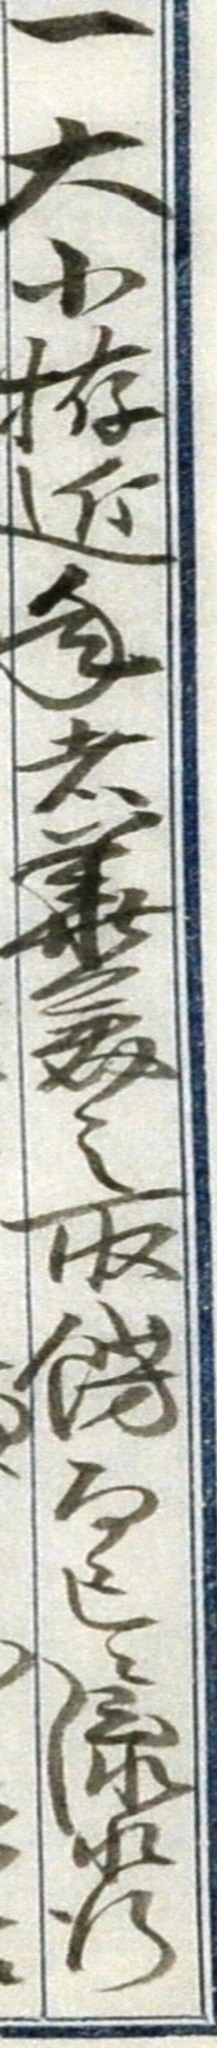一大小拵近年は華美之取錺而已ニ流れ行
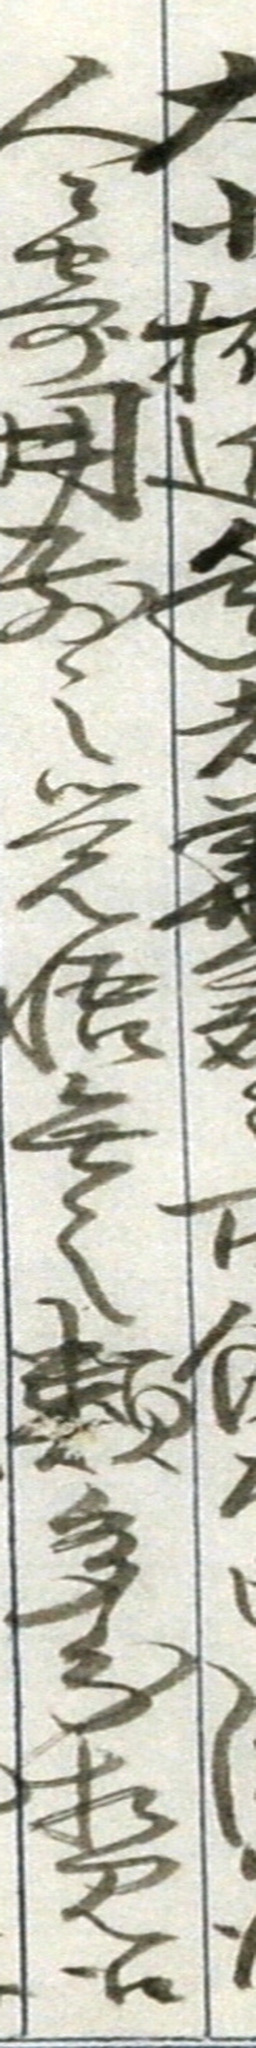人ニ寄用前之覚悟無之類多分相見え
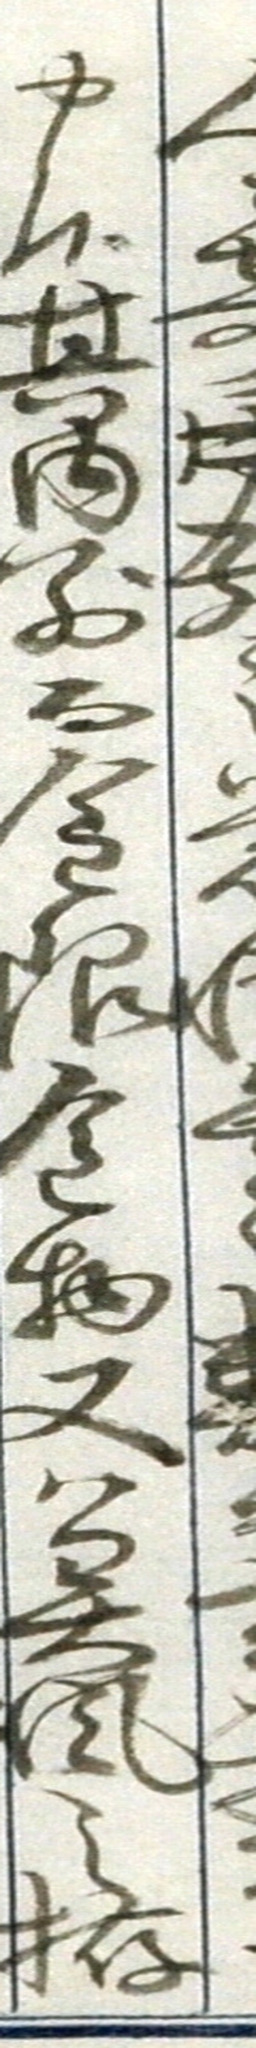申候其内別而金銀金物又ハ異風之拵
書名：御倹約被仰出書
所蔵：伊那市立高遠町図書館・合同会社AMANE
